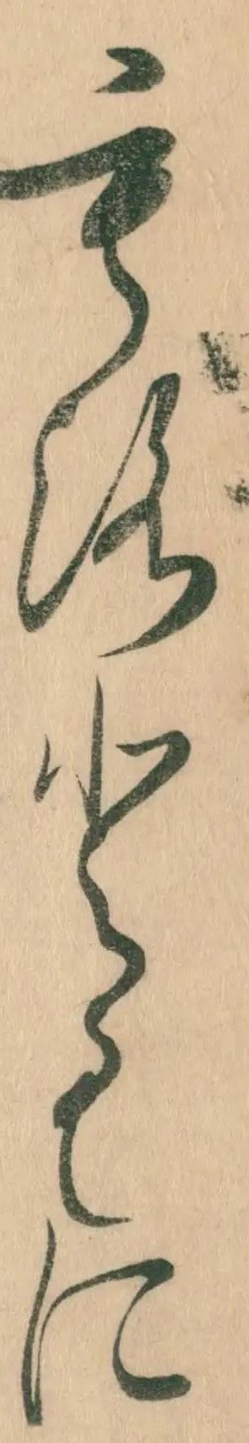もろともに
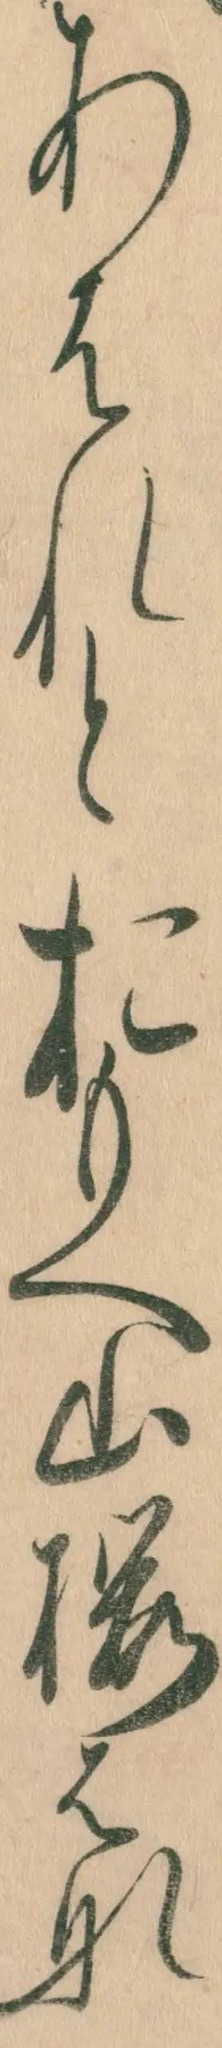あはれとおもへ山桜はな
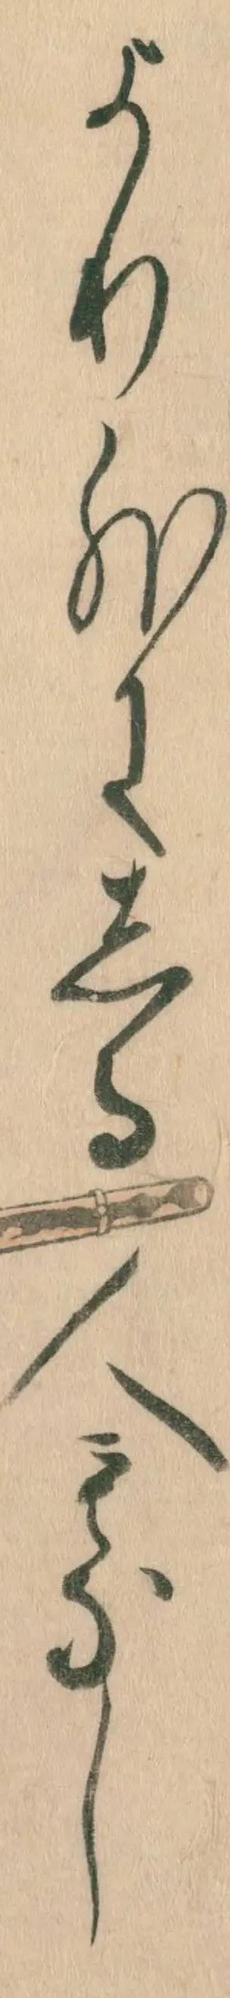より外にしる人もなし
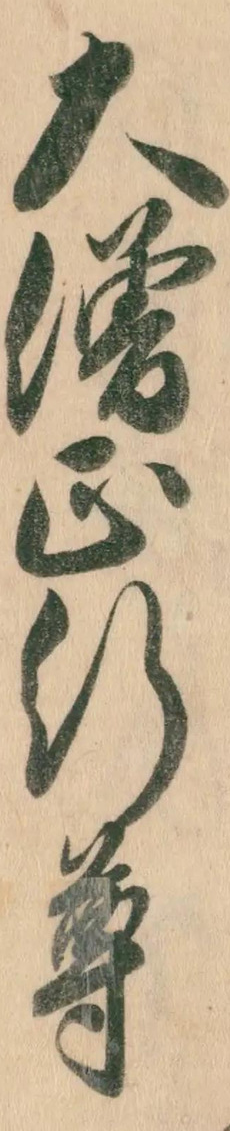大僧正行尊
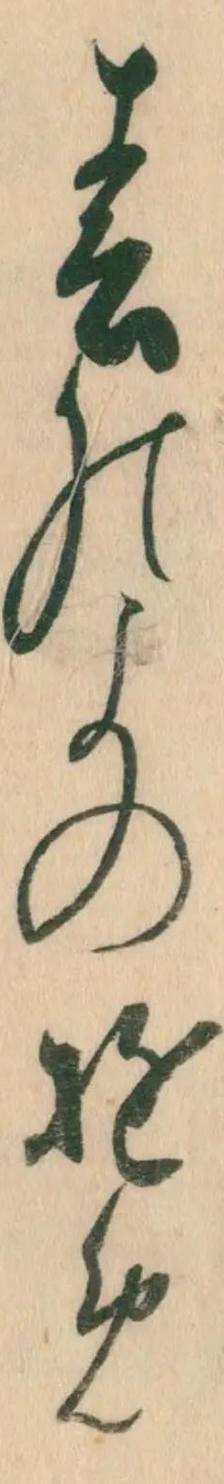春のよのゆめ

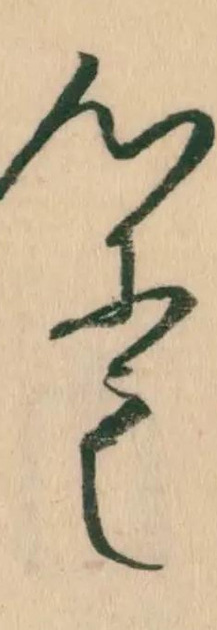心にも
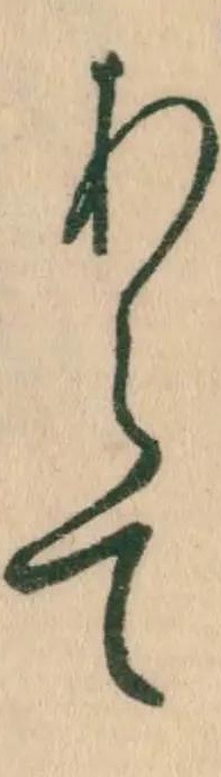あらて
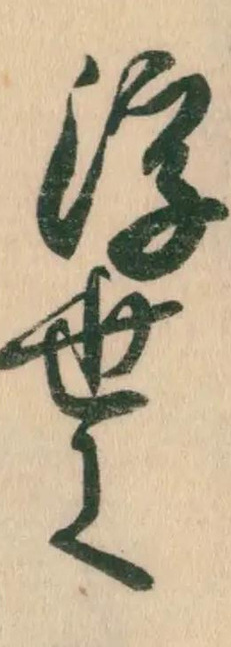浮世に
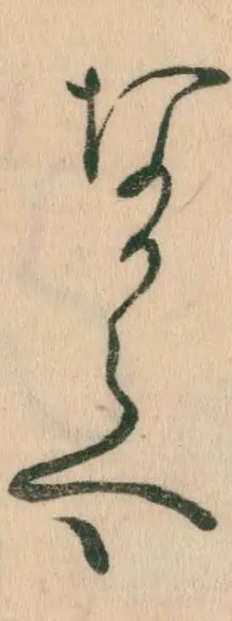なからへは
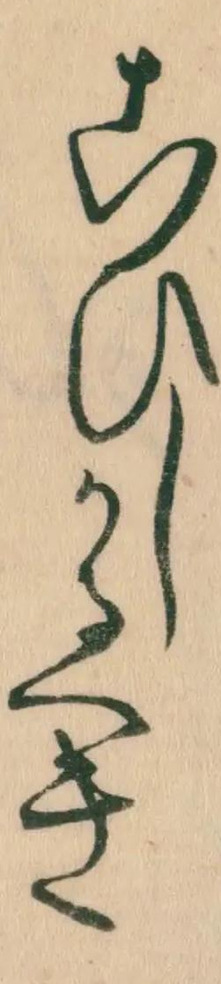こひしかるへき
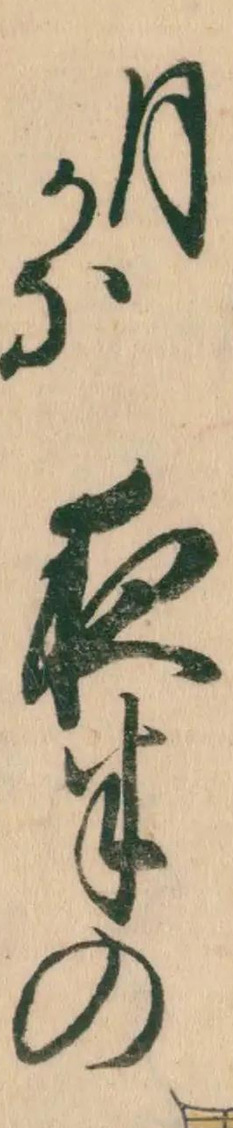月夜半の
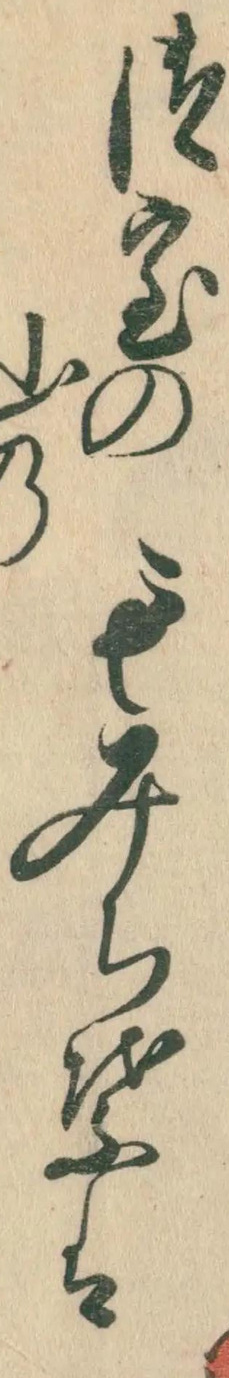御室のもみち葉は

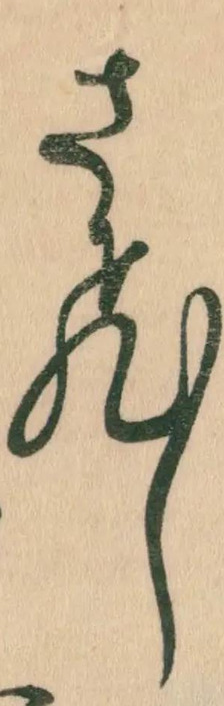さひし
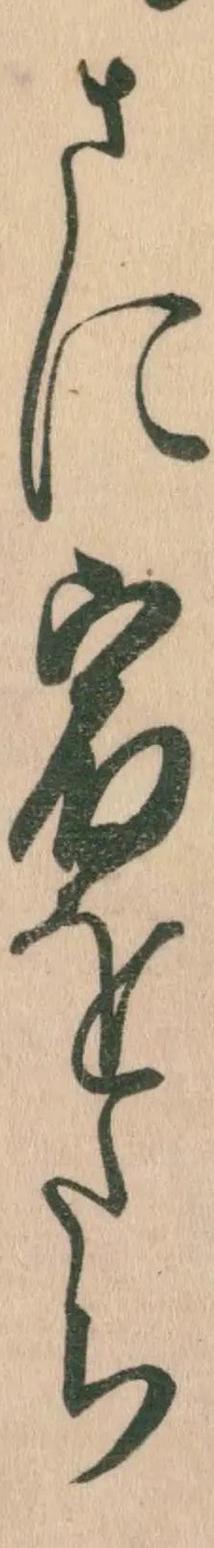さに宿をたち
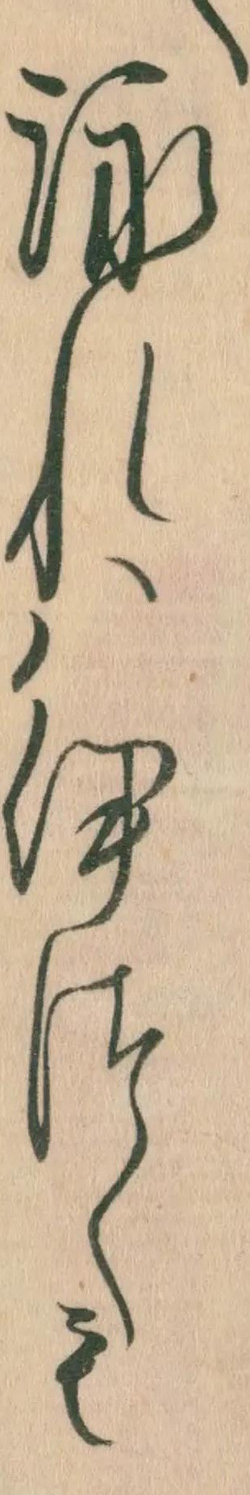詠れはいつくも
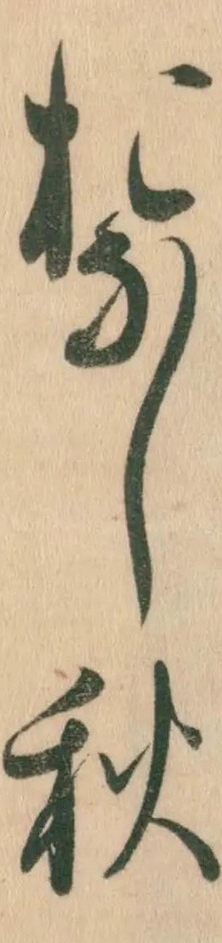おなし秋
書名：錦百人一首あつま織
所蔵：国立国会図書館 National Diet Library, JAPAN
